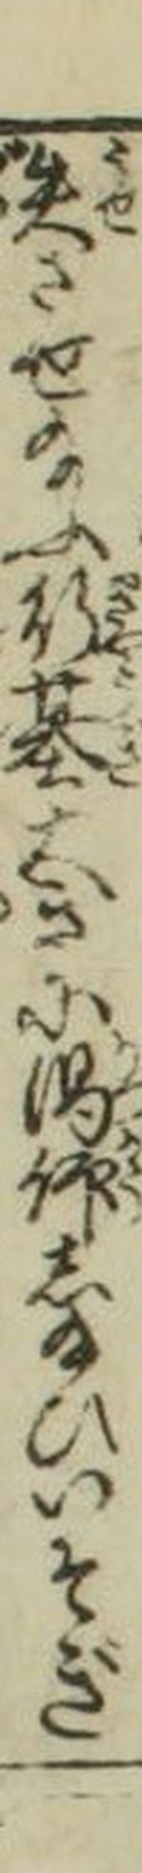失させ給ふ行基大きに渇仰し給ひいそぎ
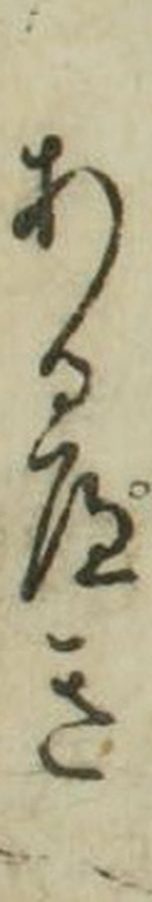あるべき
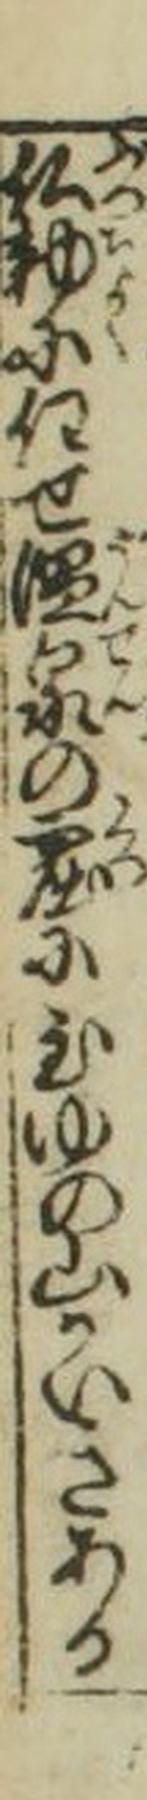仏勅に任せ温泉の窟に至ゆの山かいきある

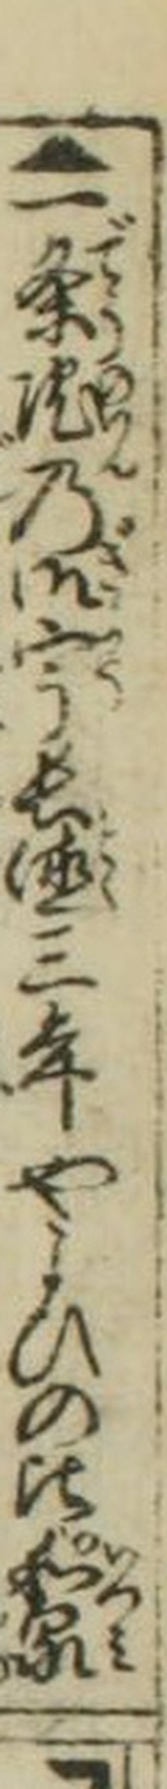▲一条院の御宇長徳三年やよひの頃。和泉
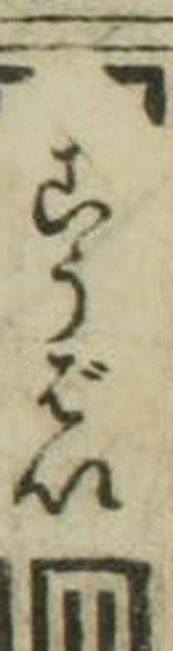こうばい
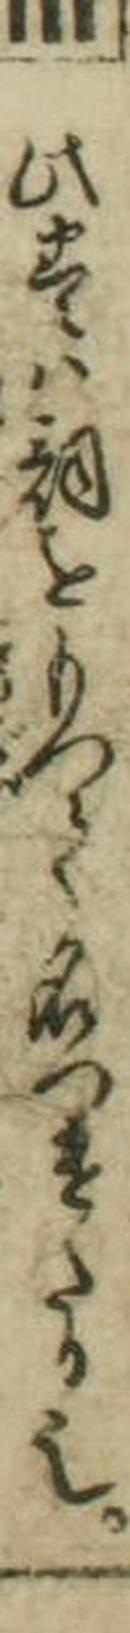此巻は詞をもつて名つけたる也。
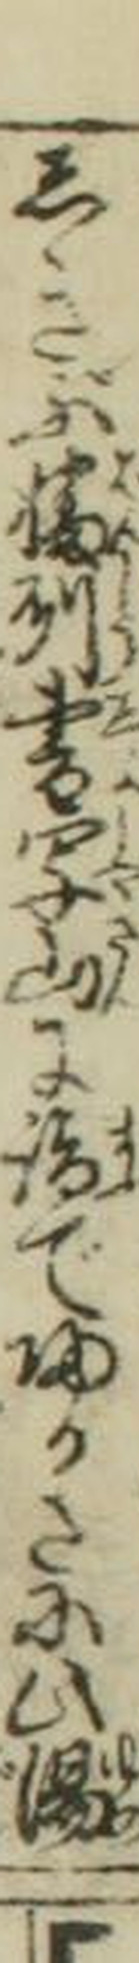しきぶ播州書写山に詣で帰るさに此湯
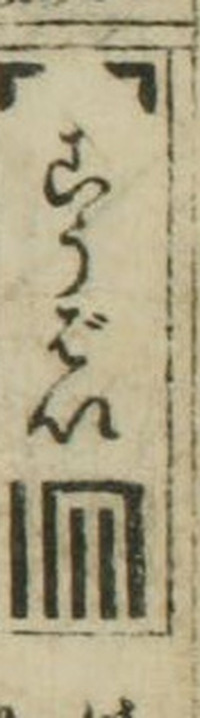こうばい
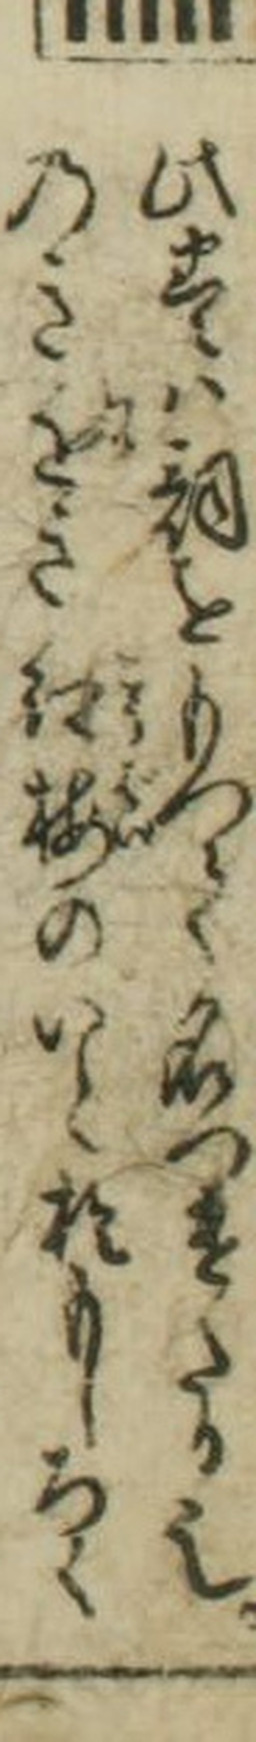のき近き紅梅のいとおもしろく
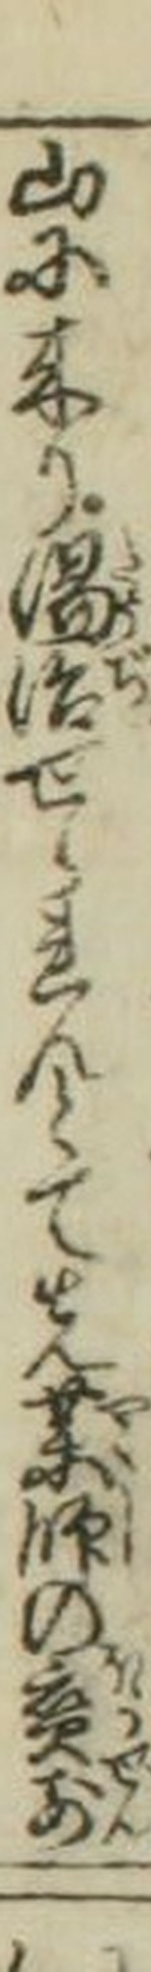山に來り。湯治せられんとて先薬師の宝前
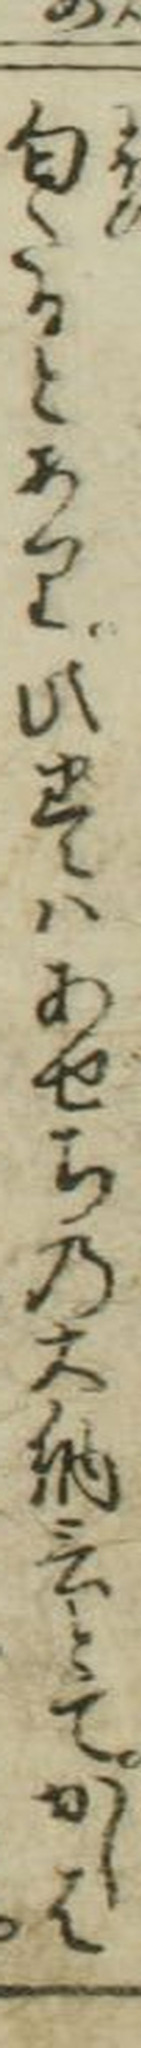匂たるとあり。此巻はあぜちの大納言とて。かしは
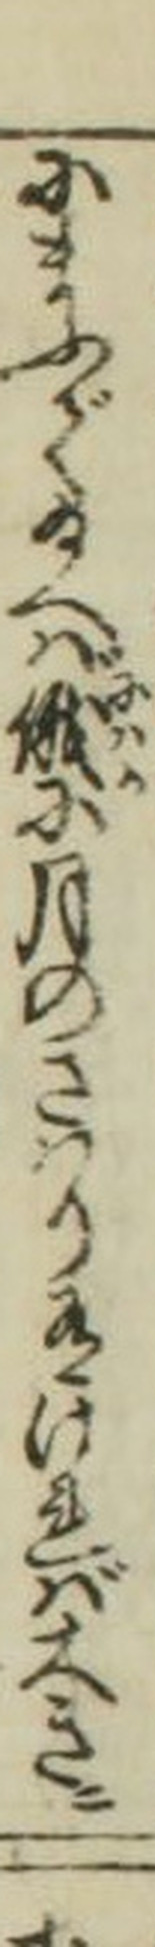にまふで給へば俄に月のさはり有ければ大きに
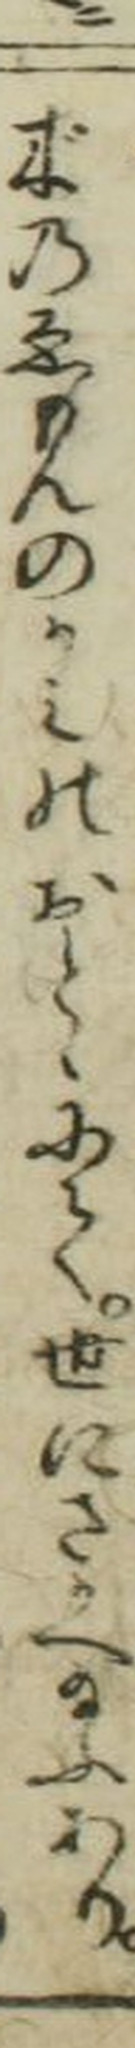ぎのゑもんのかみのおとゝにて。世にさかへ給ふあり。
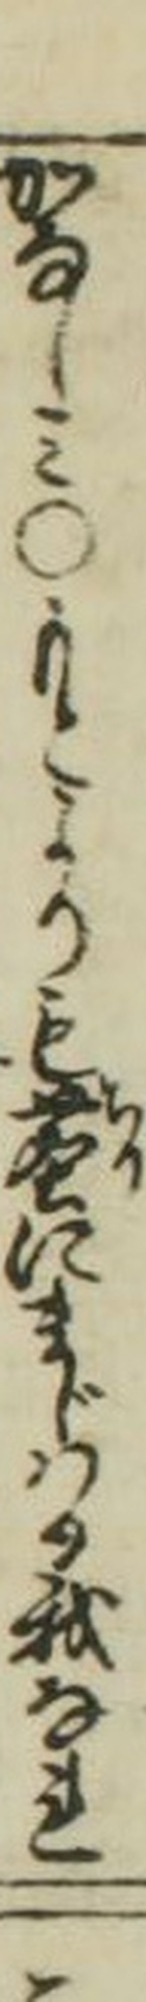かなしみ○もとよりも塵にまじはる我なれ
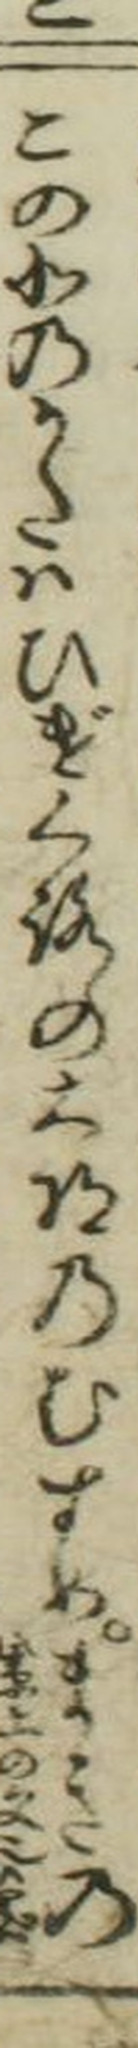この北のかたはひげくろの大将のむすめ。まきの
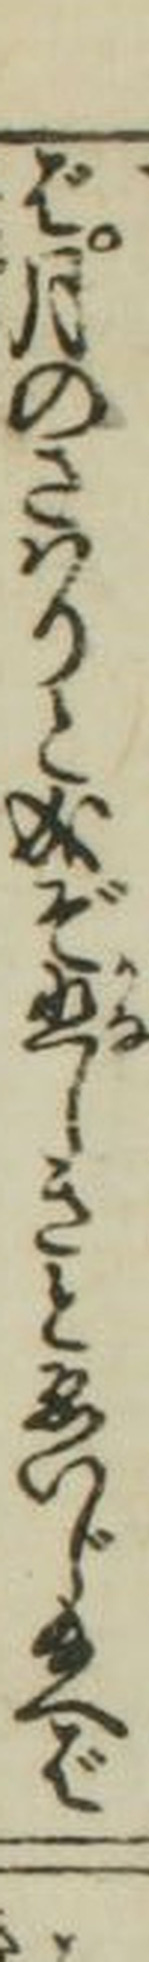ば。月のさはりと成ぞ悲しきとゑいじ給へば
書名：女源氏教訓鑑
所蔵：東京学芸大学附属図書館
